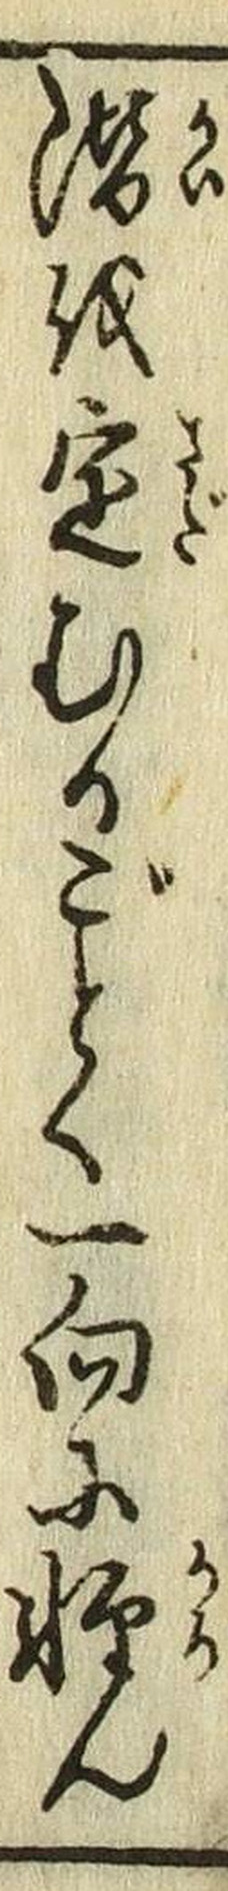階を定むるごとく一向に軽ん
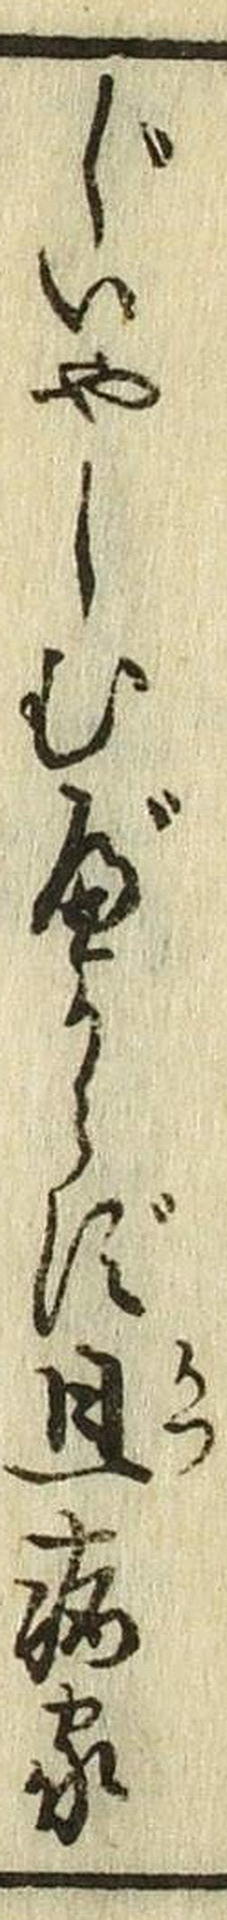じいやしむべからず且病家
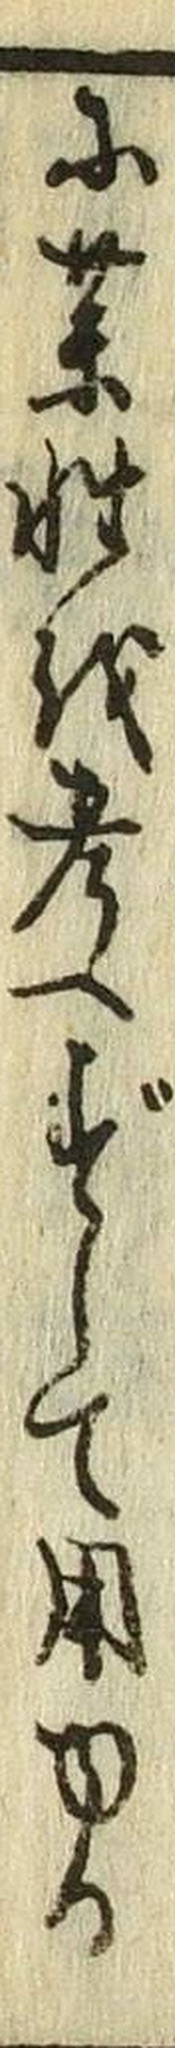に薬性を考へずして用ゆる
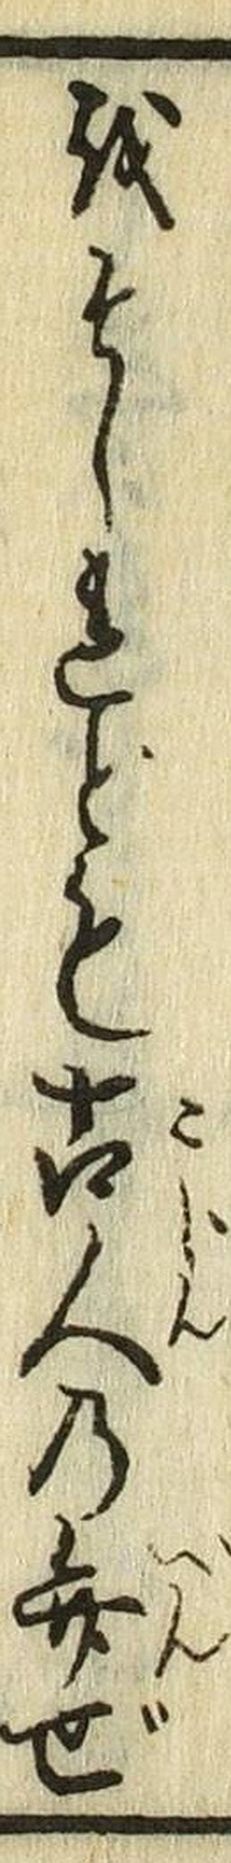をそしれども古人の弁ぜ
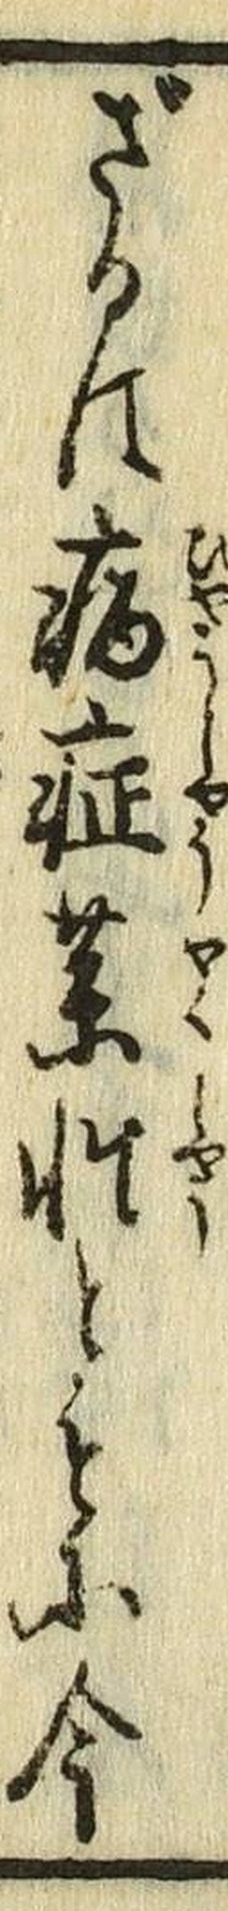ざるは病症薬性ともに今
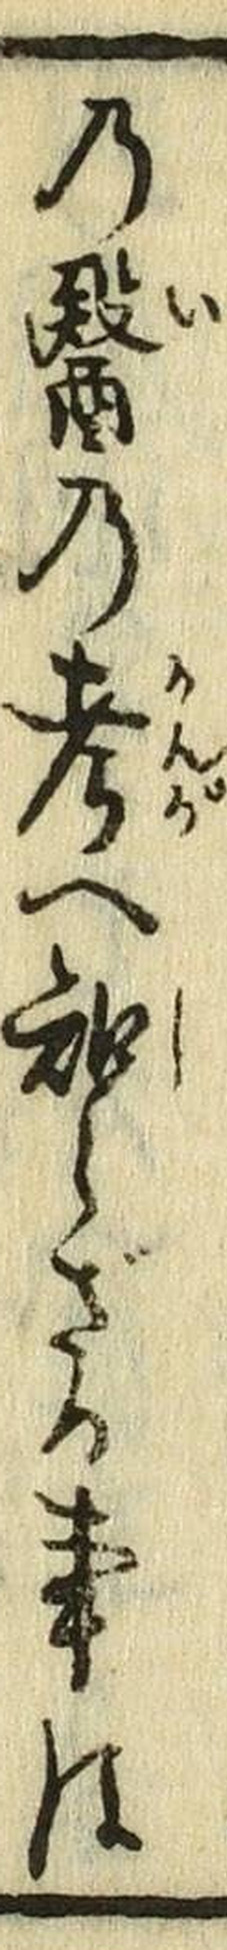の医の考へ知らざる事は
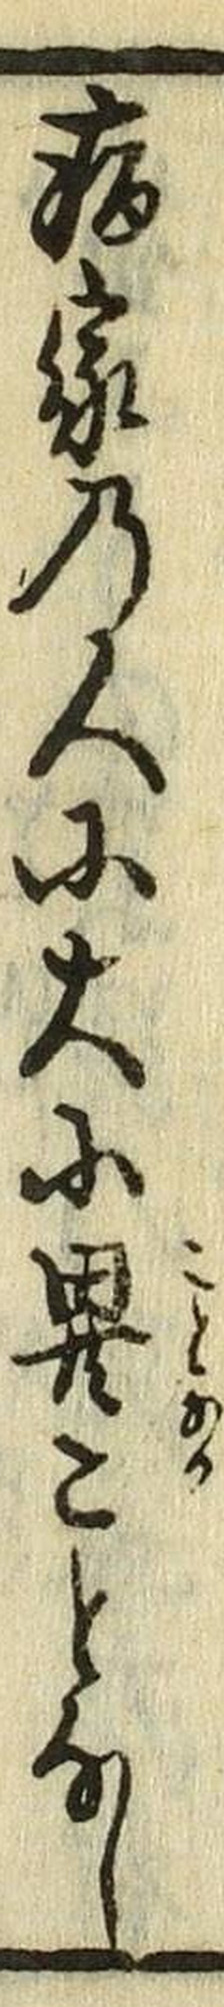病家の人に大に異ことなし
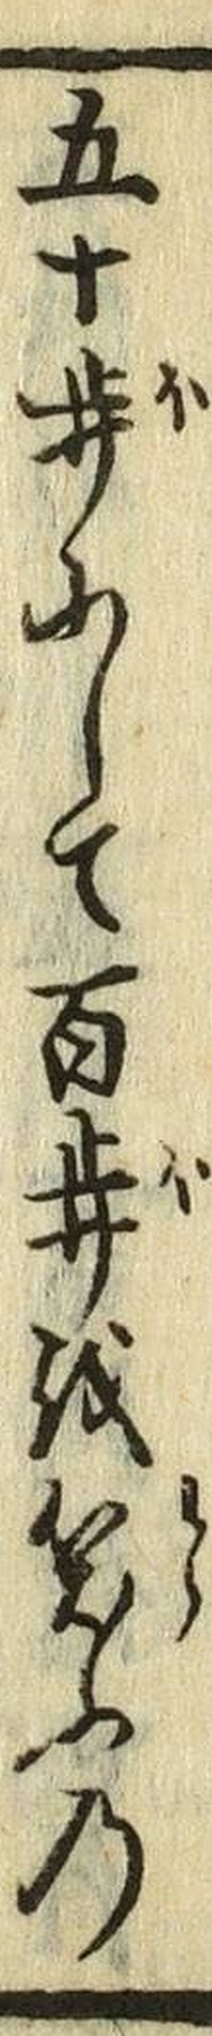五十歩にして百歩を笑ふの
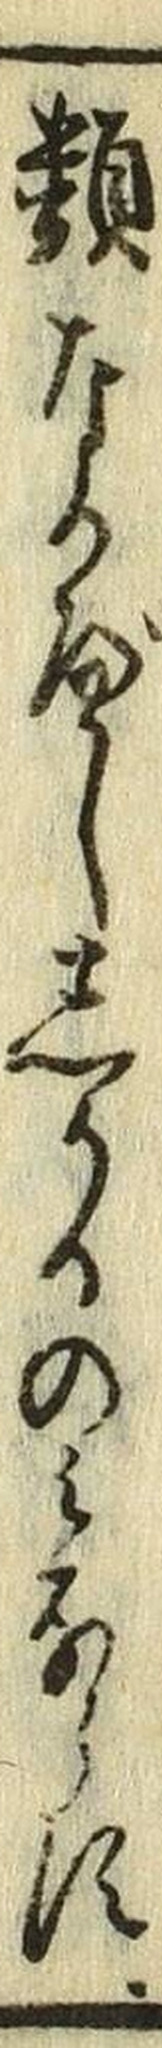類なるべししかるのみならず
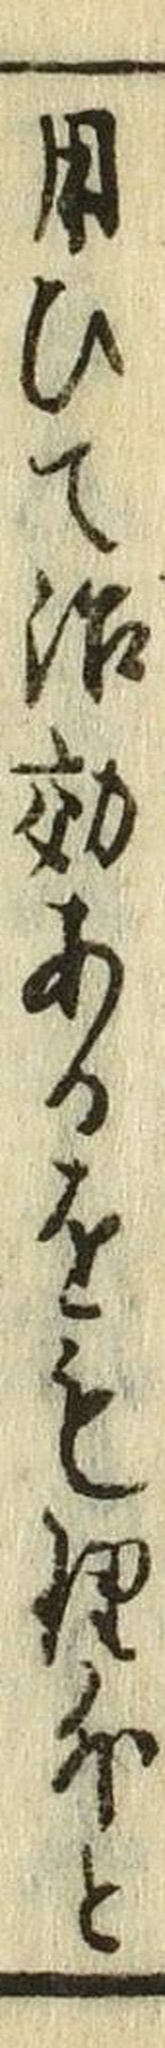用ひて治効あるをも理外と
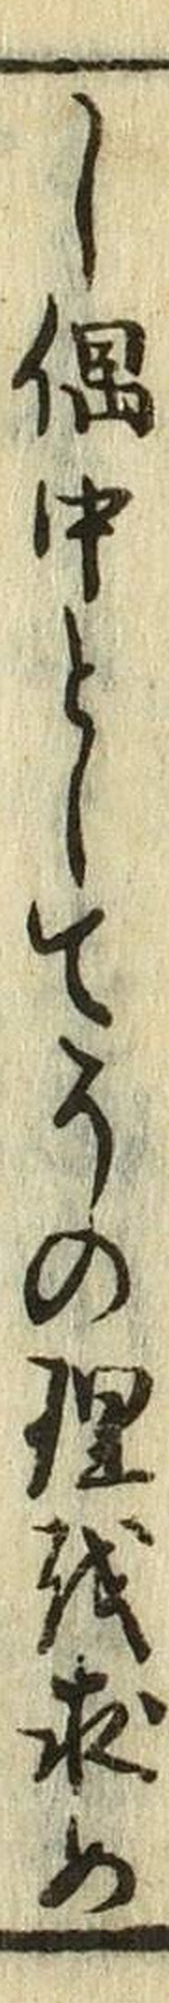し偶中としてその理を求め
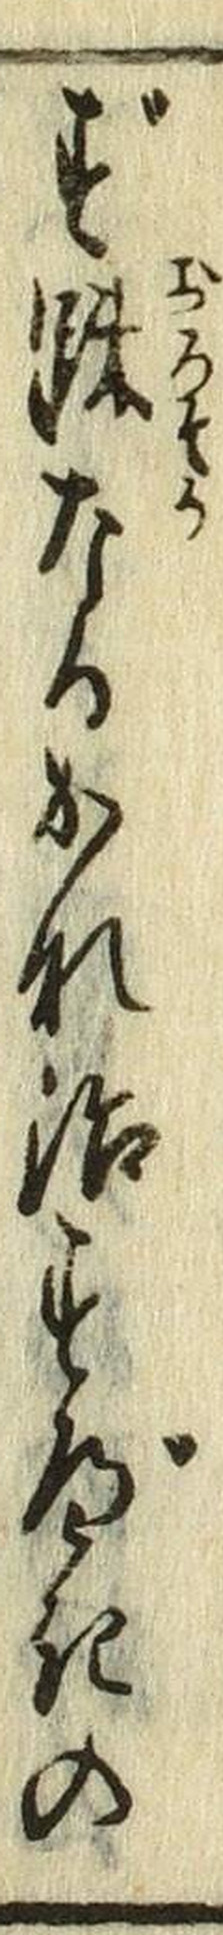ず疎なるかれ治するべきの
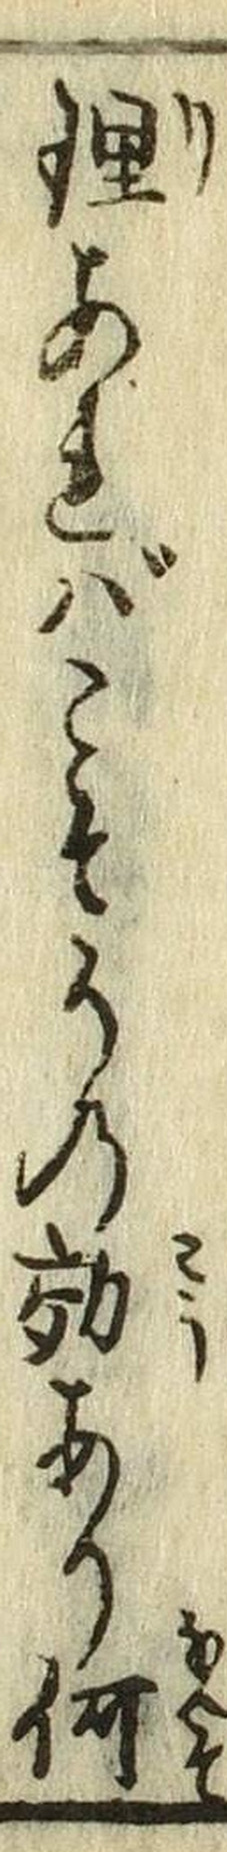理あればこそその効あり何
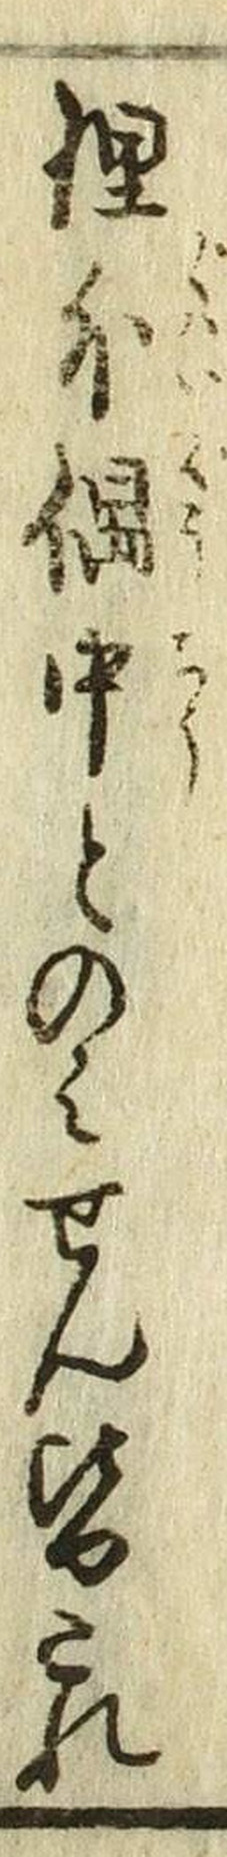理外偶中とのみせん皆これ
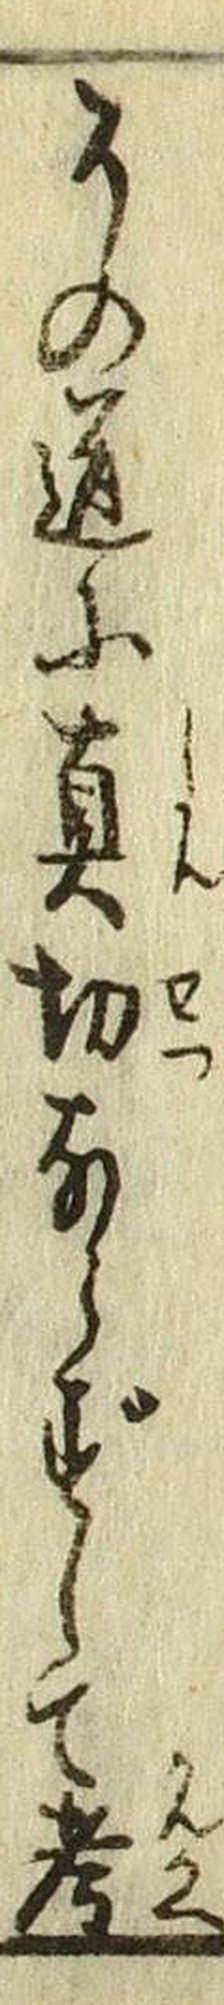その道に真切ならずして考
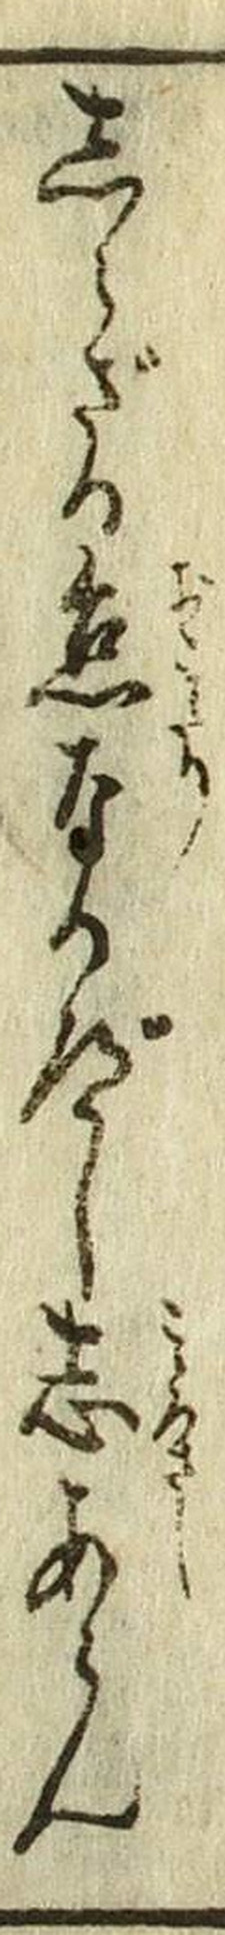しらざる怠なるべし志あらん
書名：居家養生記
